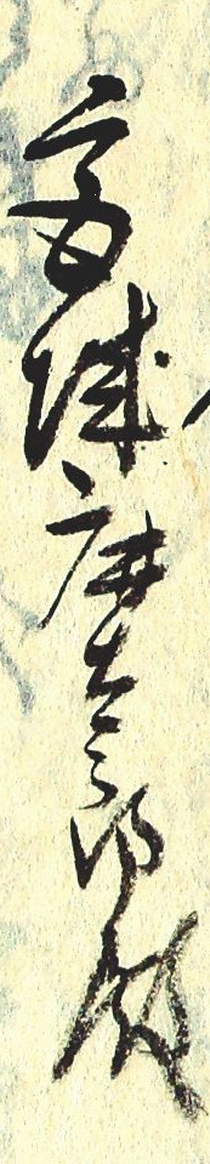宮城麻太郎殿
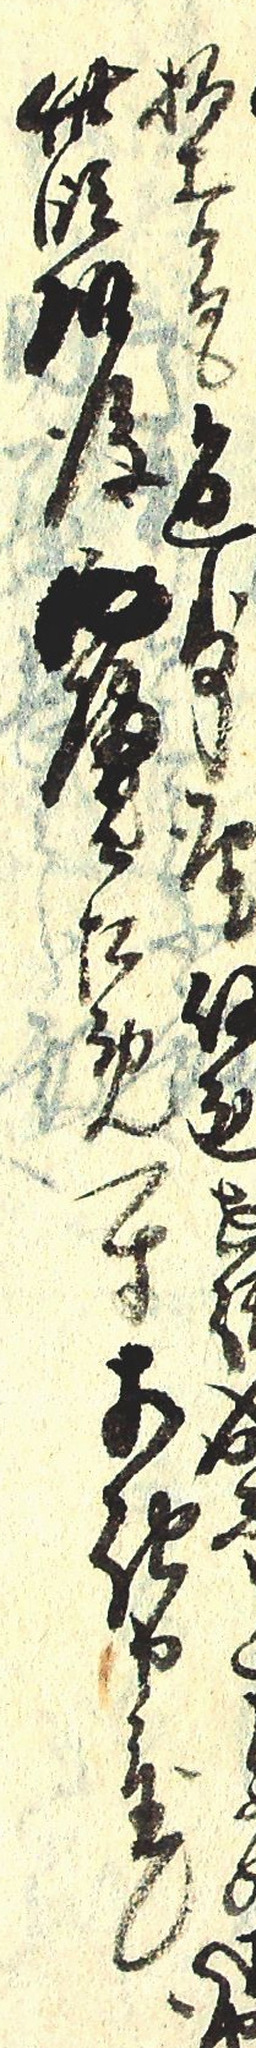此段以後之ため一寸相記申置候

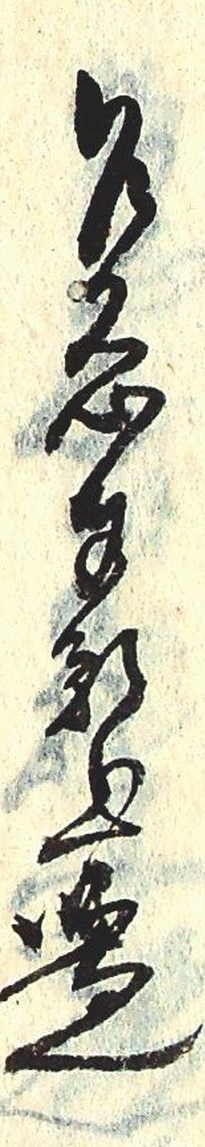乍恐奉願上覚
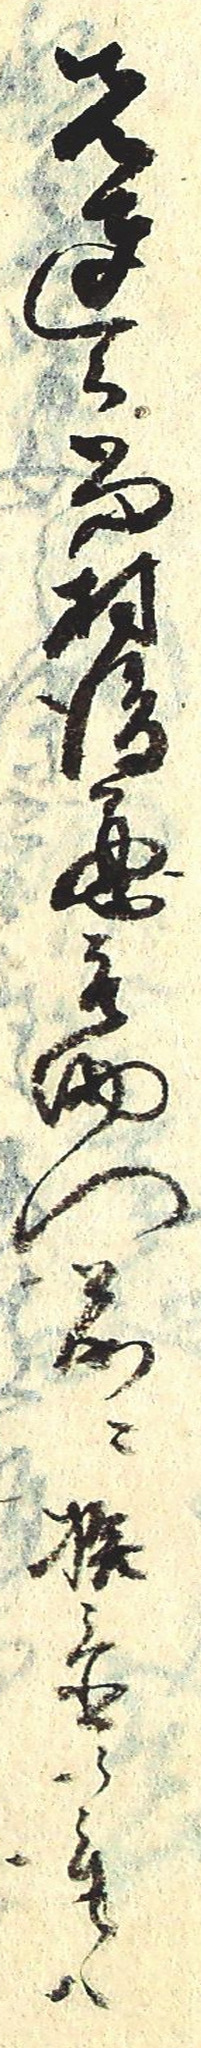先達て当村後藤庄助門前に捨置御座候
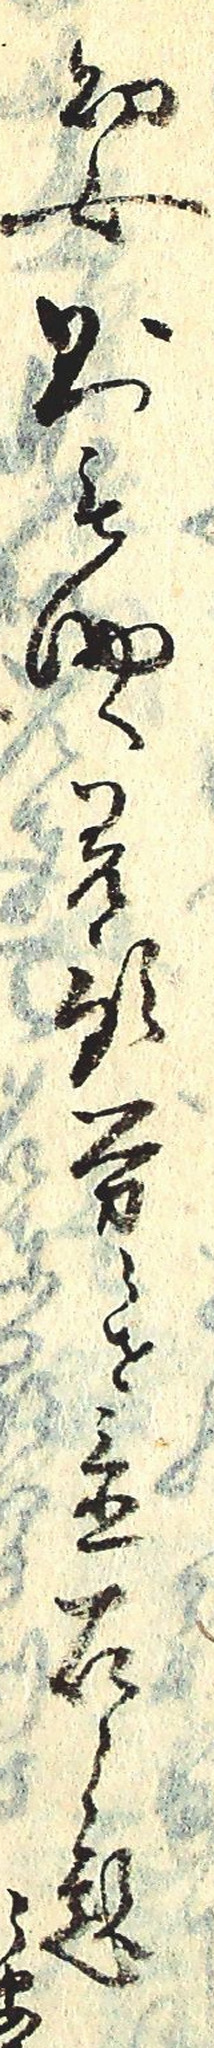幼女則庄助へ差預労らせ置右之趣御案内
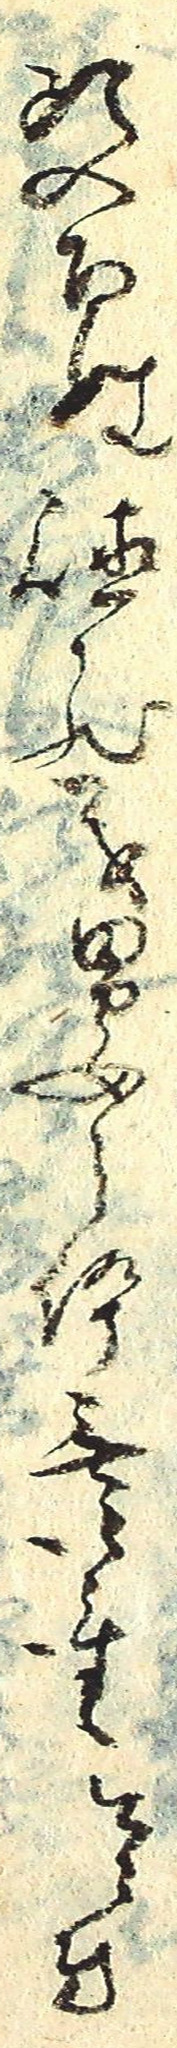頭入百姓徳蔵義男女之倅無御座候に付
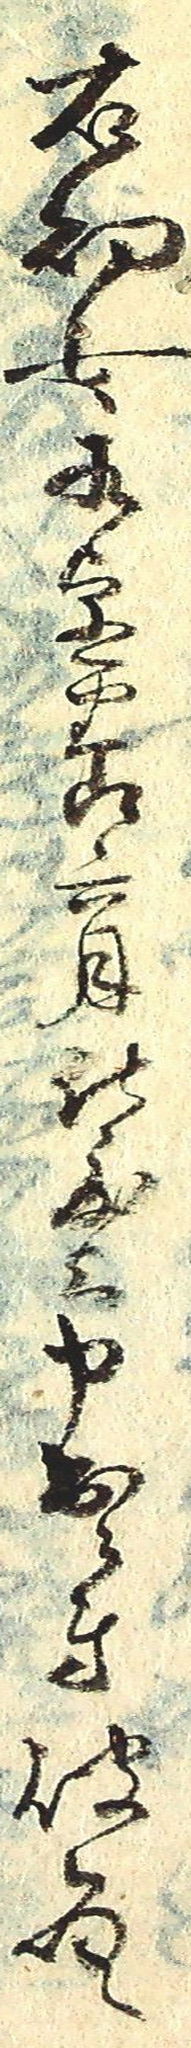右幼女相望養育仕度旨申出に付彼者へ
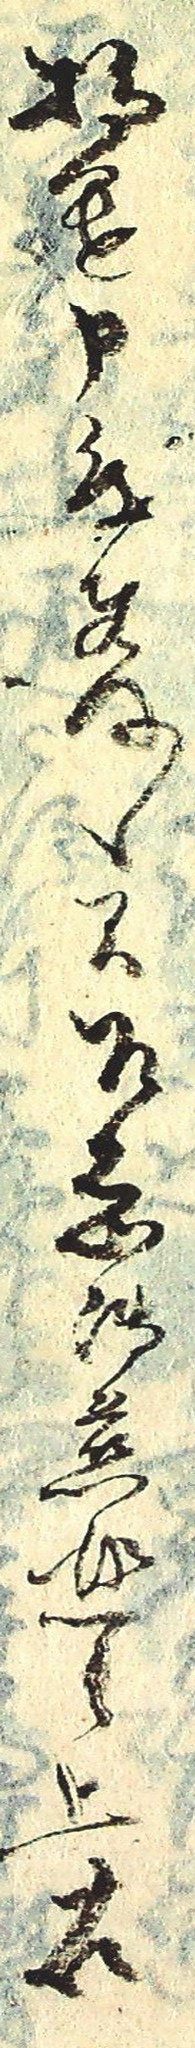指遣申度奉存候間乍恐御慈悲之上右
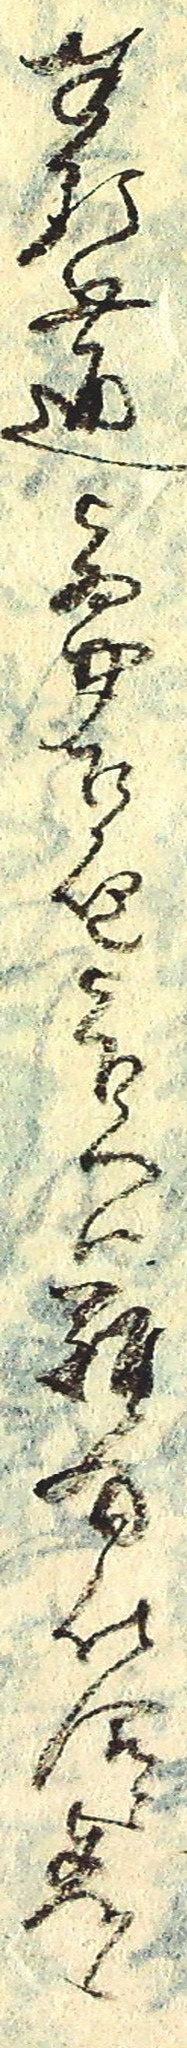奉願上通被為聞召届被下候へは難有仕合に奉存候
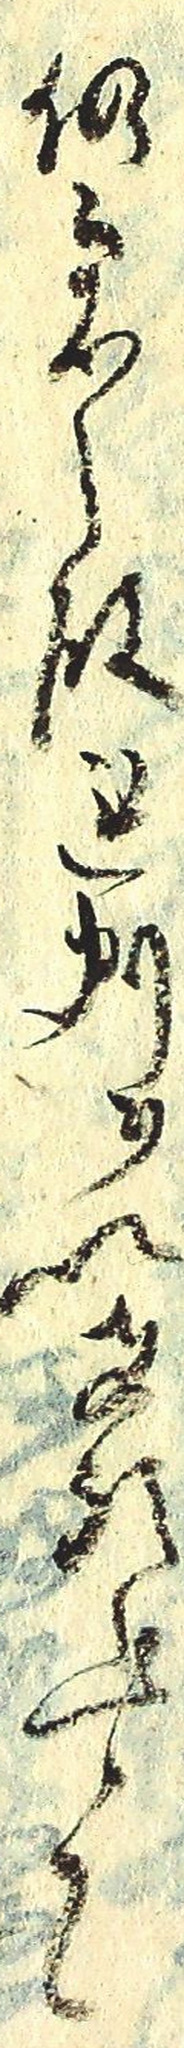仍て右之段連判を以奉願上候以上
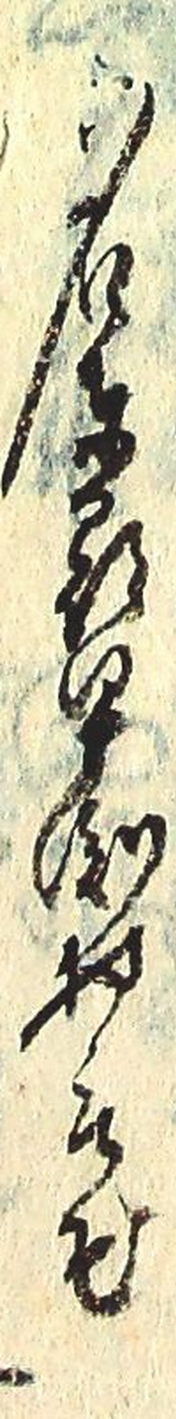名東郡早淵村庄屋
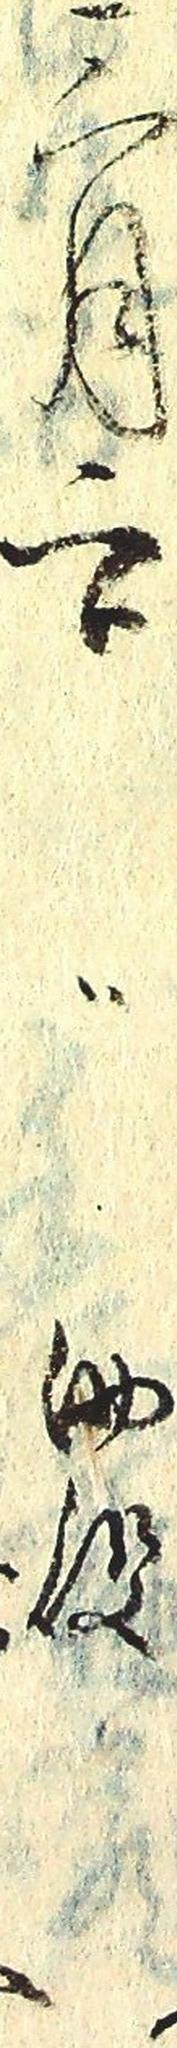三月二日同助役
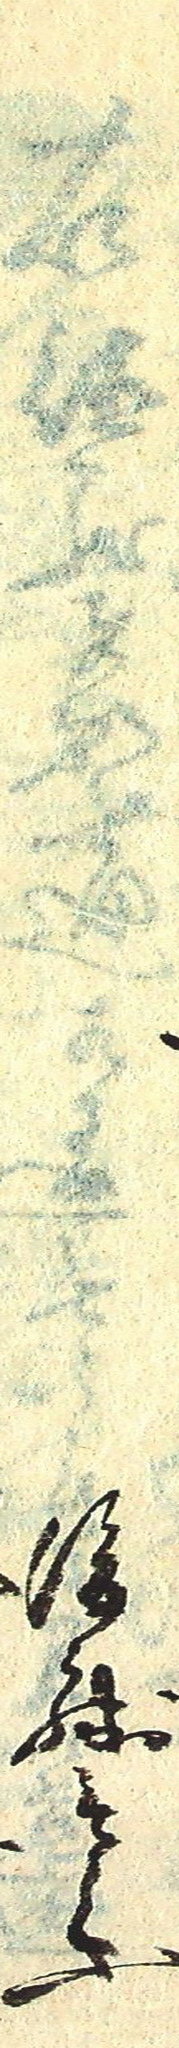後藤庄兵衛
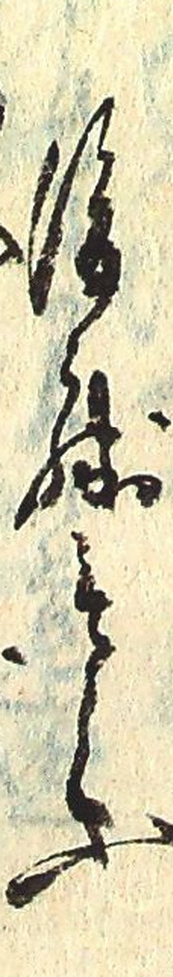後藤庄兵衛
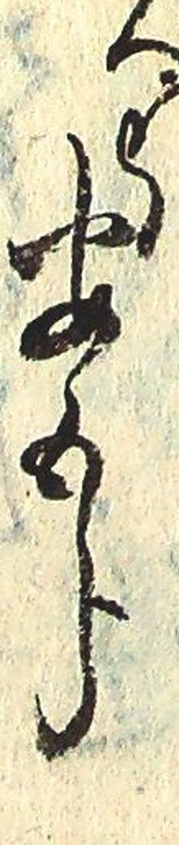安五郎
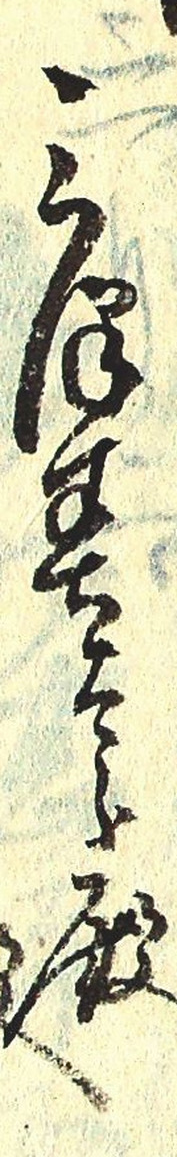三沢春太郎殿
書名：諸御願書控(弐番）
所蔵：鳴門教育大学 Naruto University of Education
